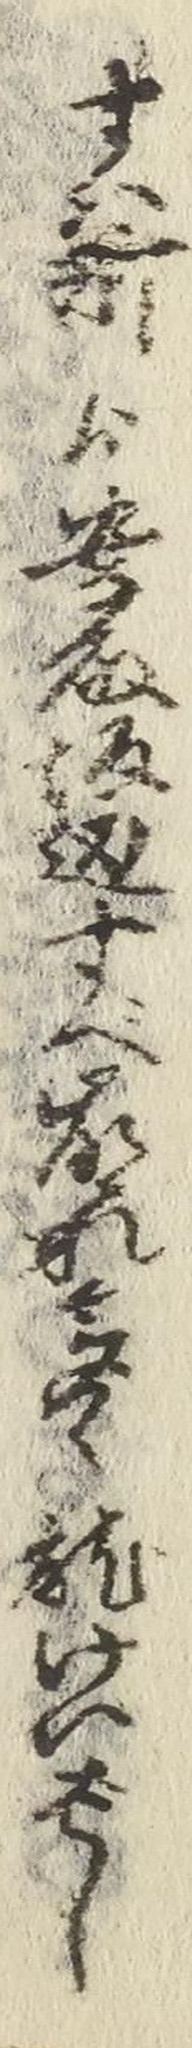すは町ゟ安藤坂辺すべ崩れ多く龍けいばし
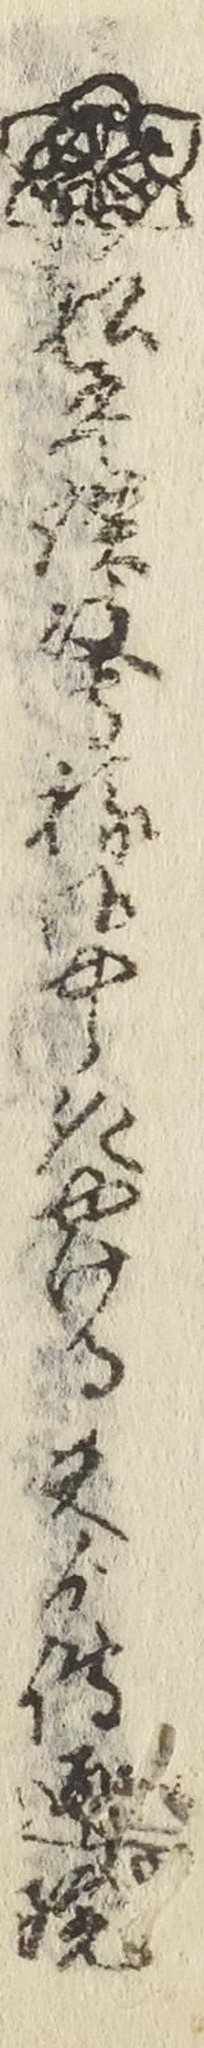松平讃岐守様御やしきやける夫ゟ伝通院
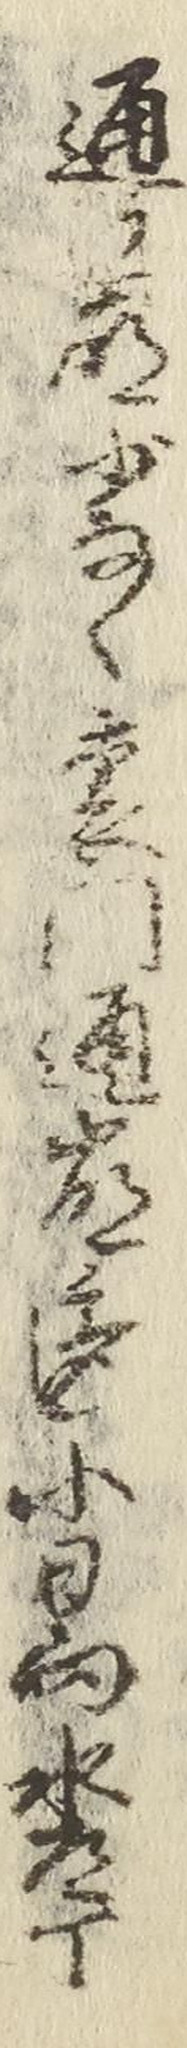通り崩少なく裏門通崩多し小日向水道丁
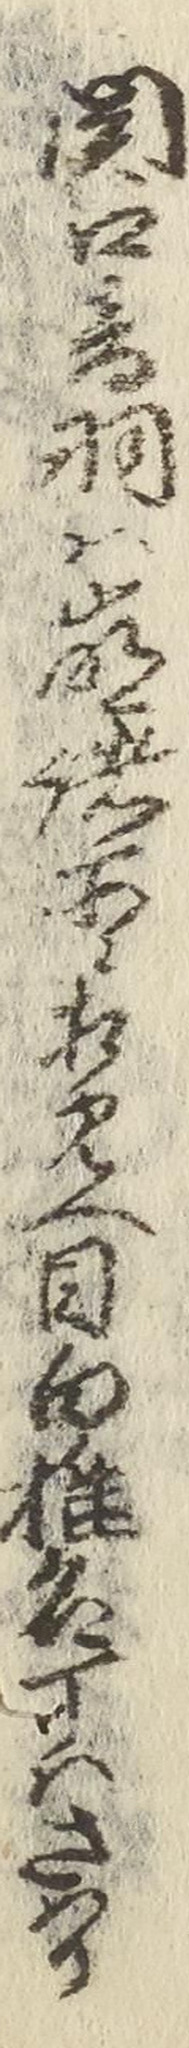関口音羽は崩諸所々相見へ目白椎名丁はさはり
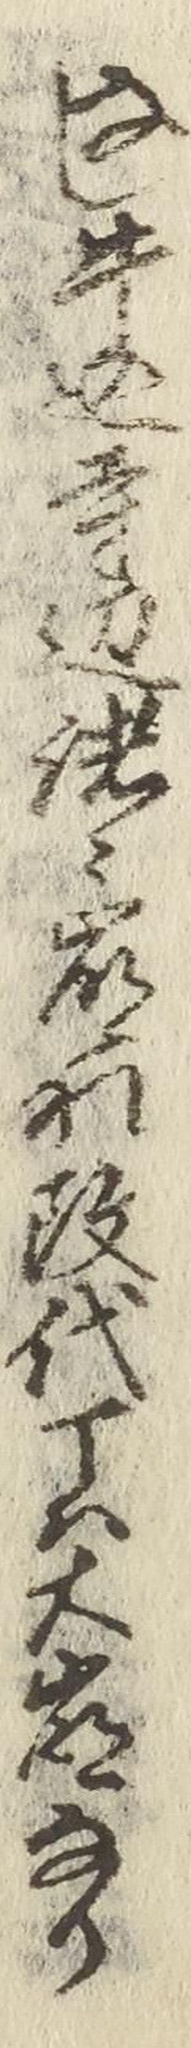なし牛込寺辺諸々崩れ改代丁は大崩なり
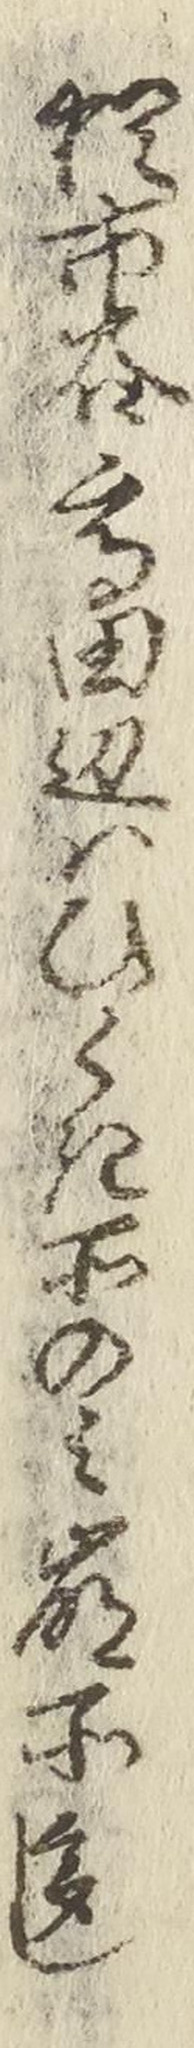猶市谷高田辺はひくき所のみ崩所多し

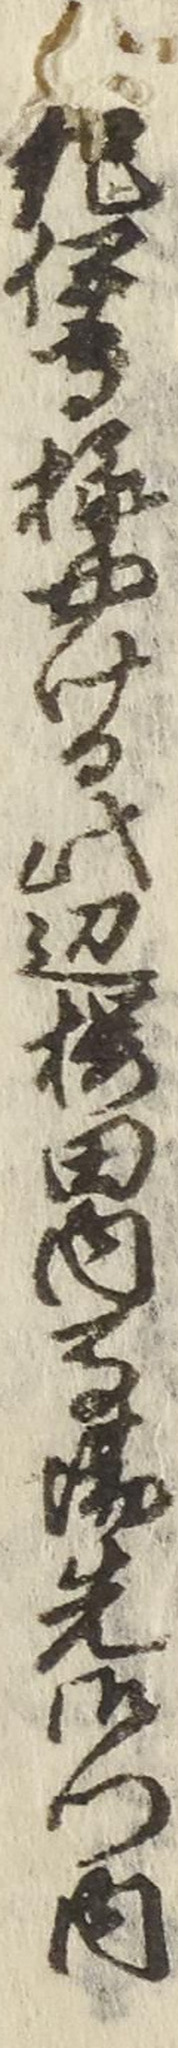紀伊守様やける此辺桜田内馬場先御門内
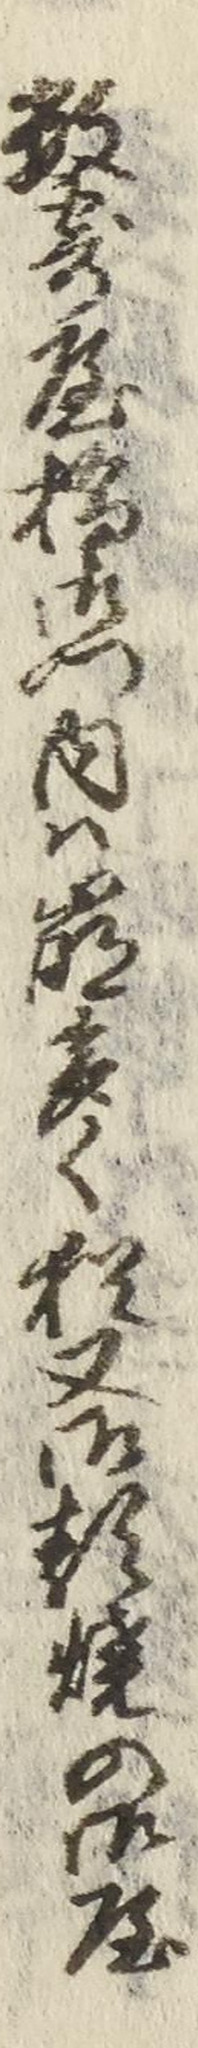数寄屋橋御門内は崩多く猶又御類焼の御屋
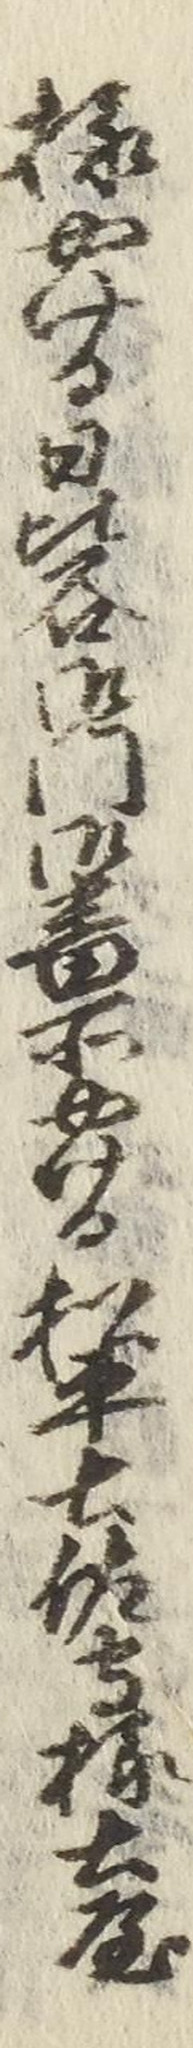様やける日比谷御門御番所やける松平土佐守様土屋
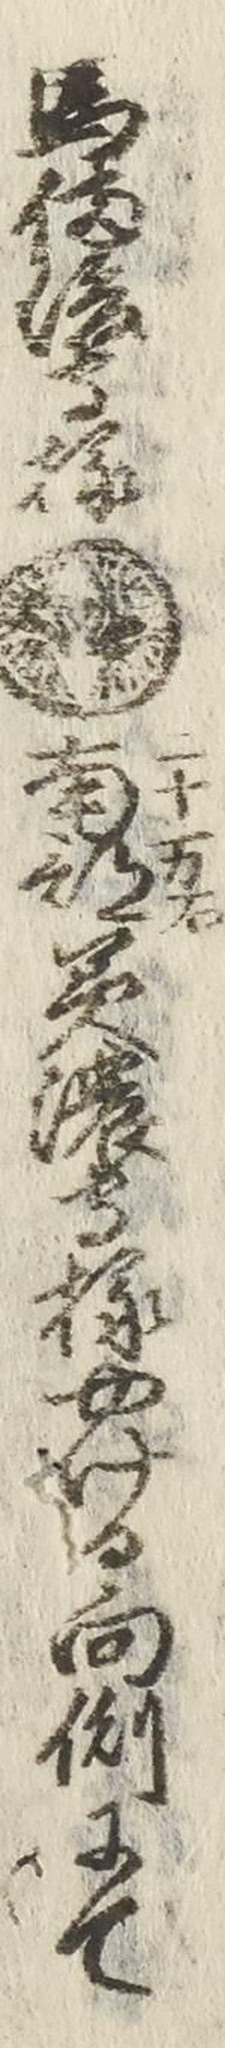馬備後守様二十万石南部美濃守様やける向側にて
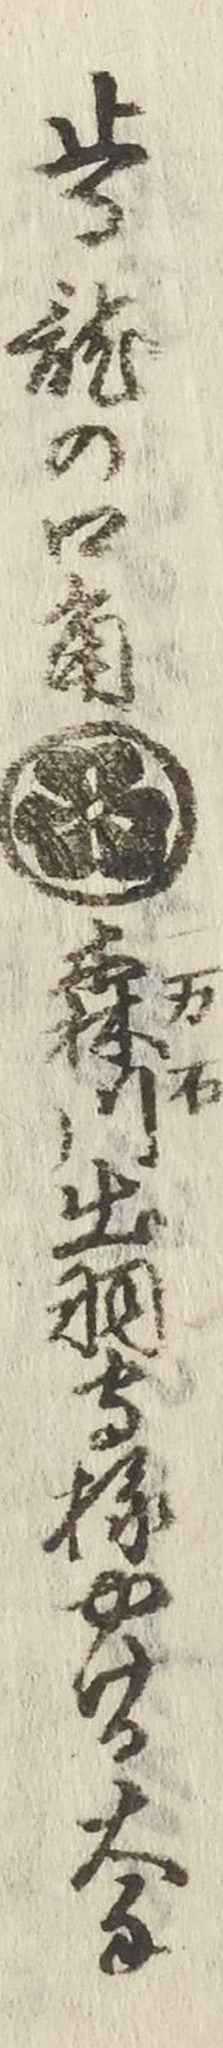止る龍の口角一万石森川出羽守様やける大手
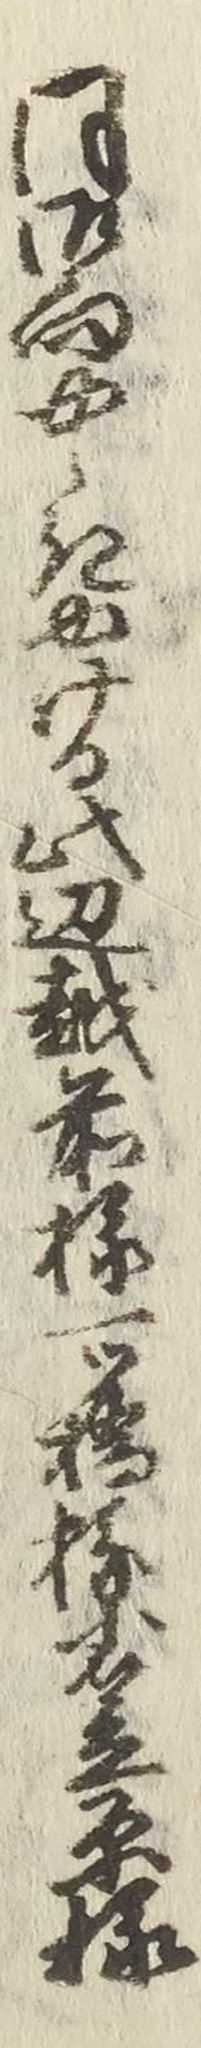同向やしきやける此辺越前様一ッ橋様小笠原様
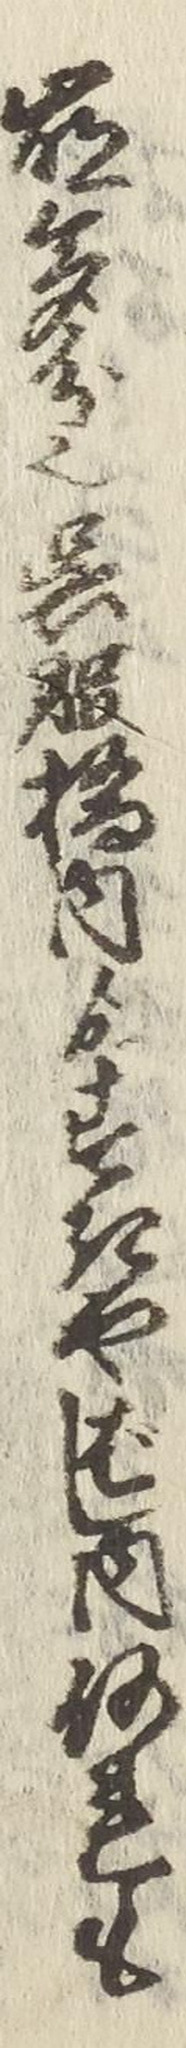崩多分也呉服橋内ゟすきやばし内何れも
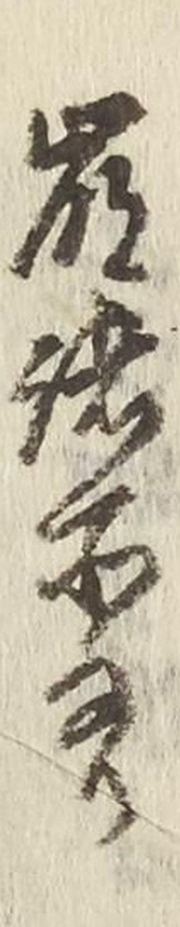崩諸所なり
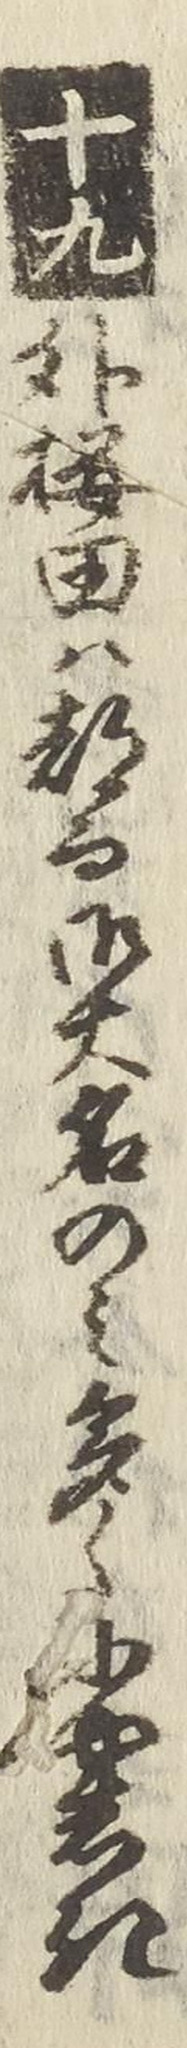十九外桜田は都而御大名のみ多く小屋敷
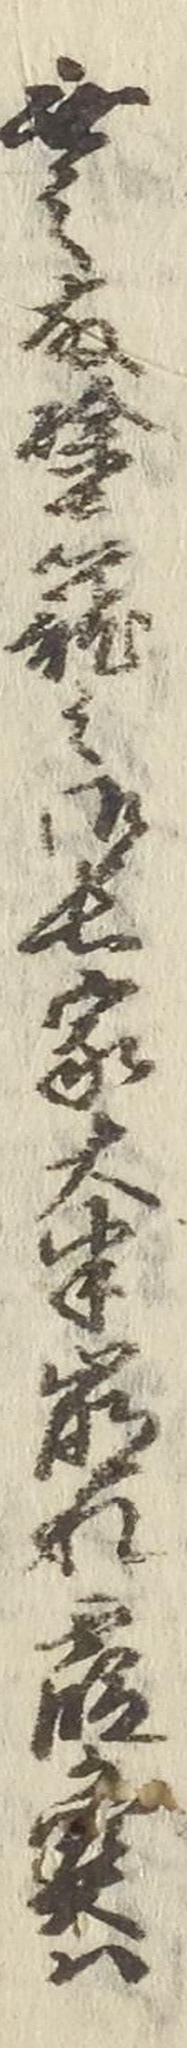無之故塗籠の御長家大半崩れ霞か関は
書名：地震出火　男女死人怪我人書上之寫
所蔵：東京大学地震研究所図書室 Earthquake Research Institute Library, The University of Tokyo, JAPAN
